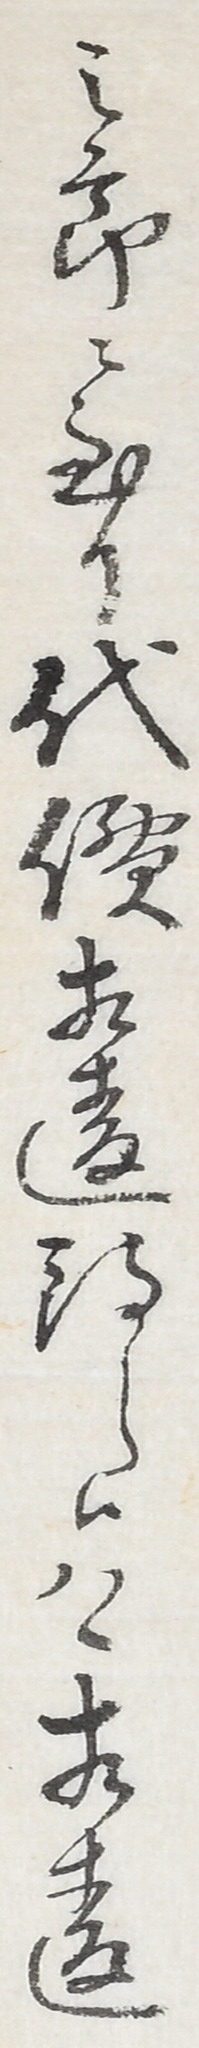之節ニ至り代価相違致し候ハヽ相違
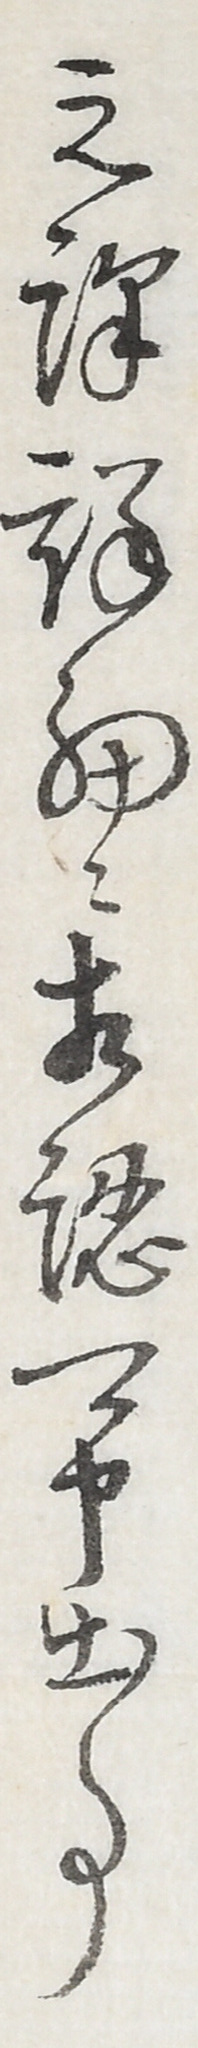之訳詳細ニ相認可申出事
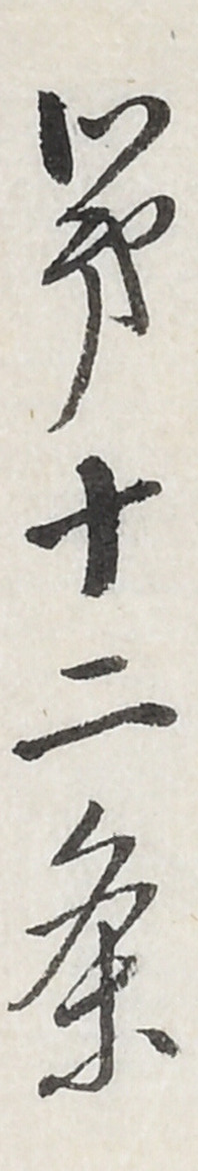第十二条
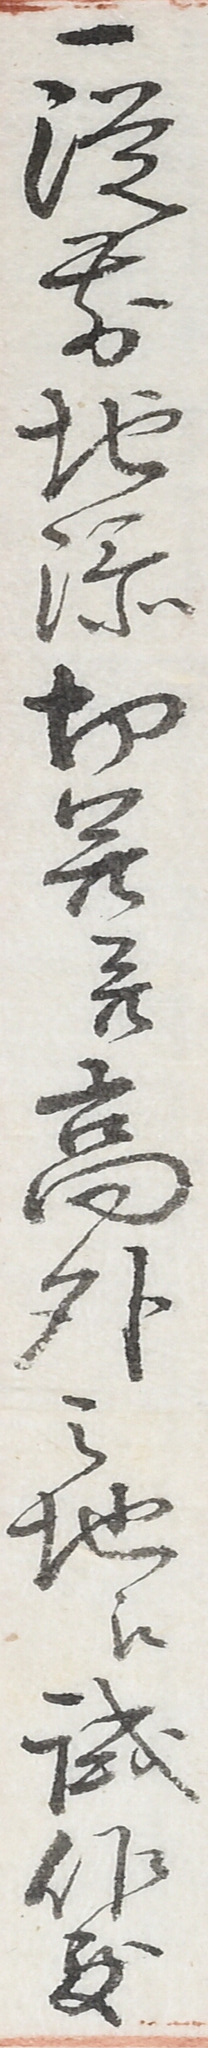一従前地添切開幷高外之地え試作致
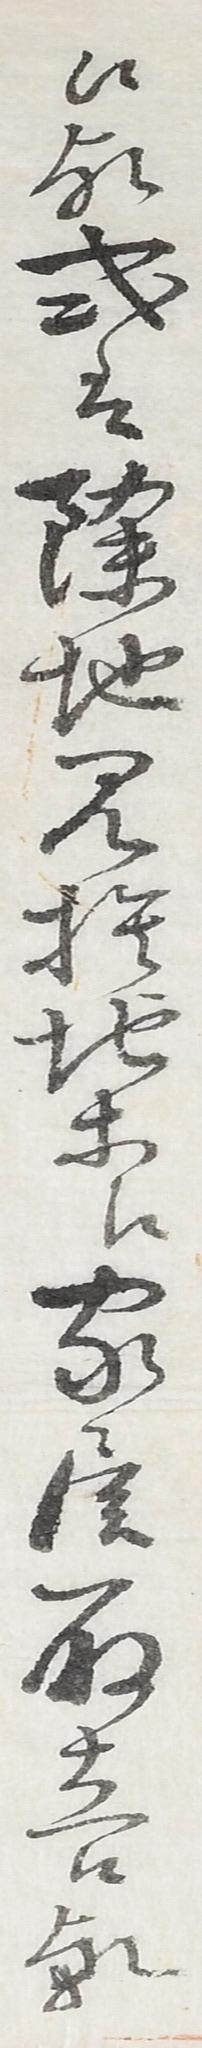候歟或は除地見捨地等え家屋取立候歟
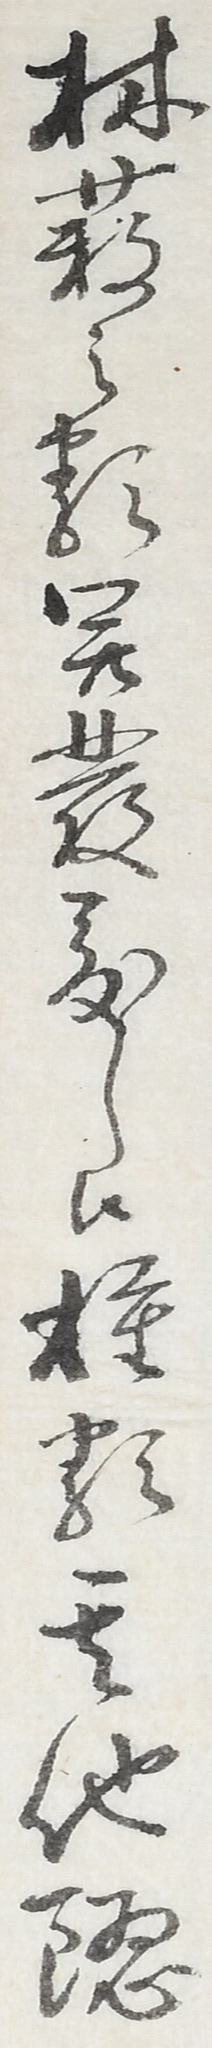林藪之類開発致し候種類其他隠
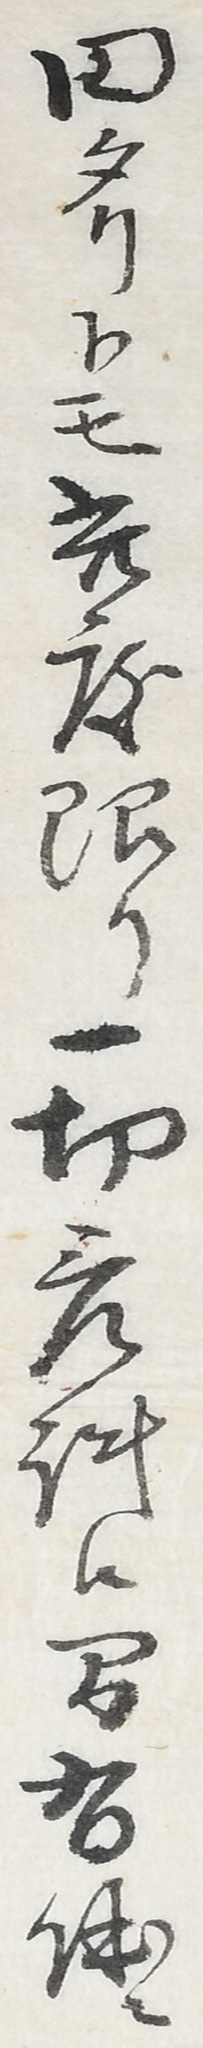田タリトモ此度限り一切差許候間有体ニ

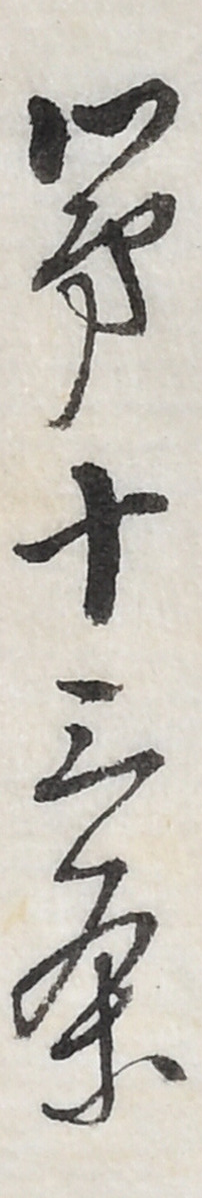第十三条
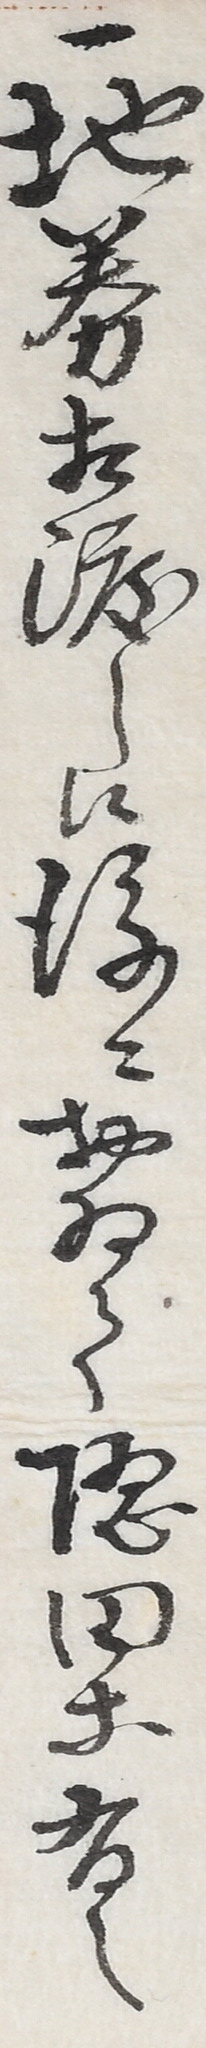一地券相渡し候後ニおゐて隠田等有之
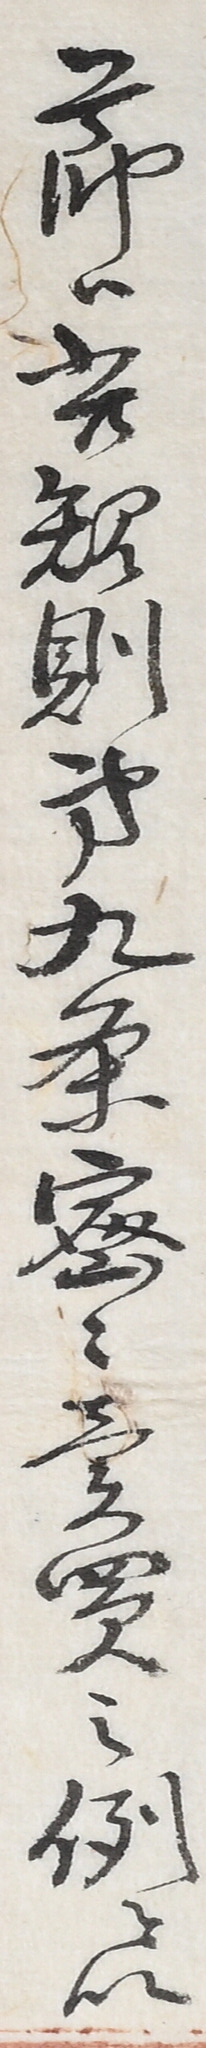節ハ此規則第九条密ニ売買之例を以
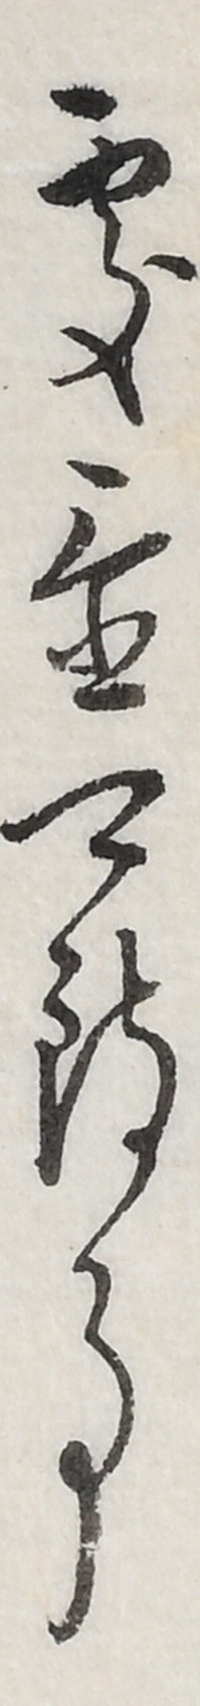処置可致事
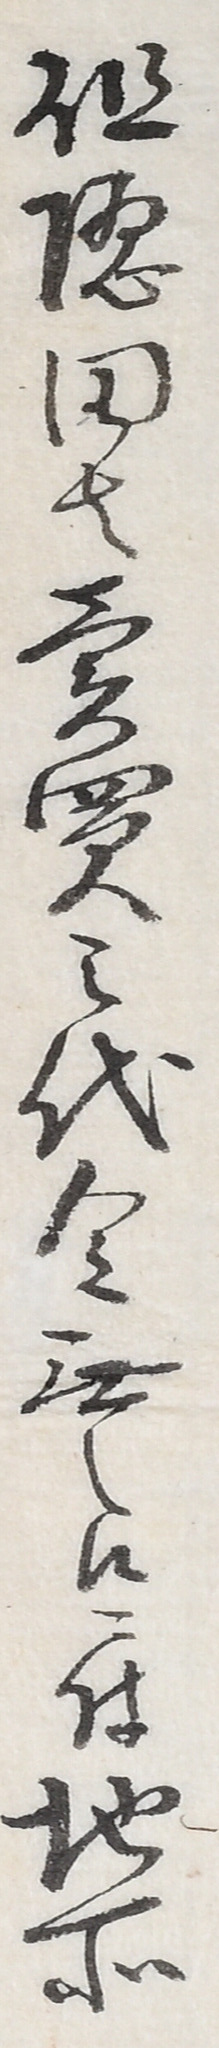但隠田は売買の代金無之候ニ付地所
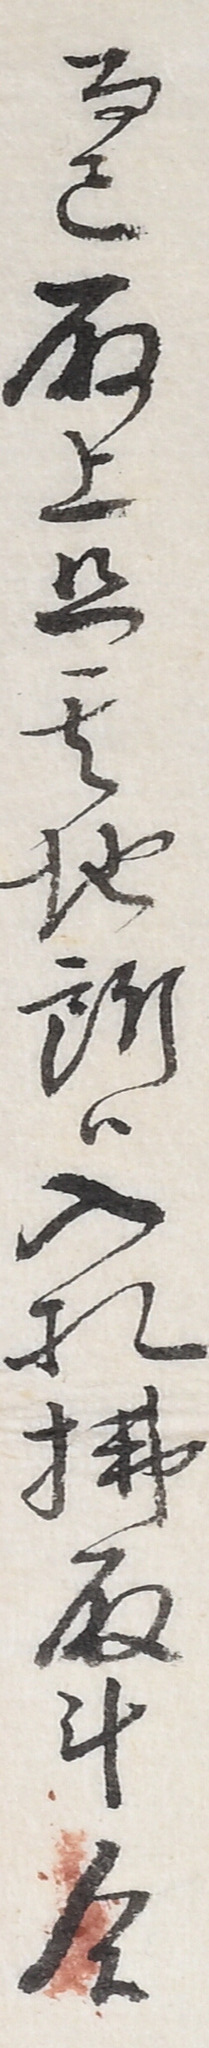而已取上且其地所ハ入札払取計合
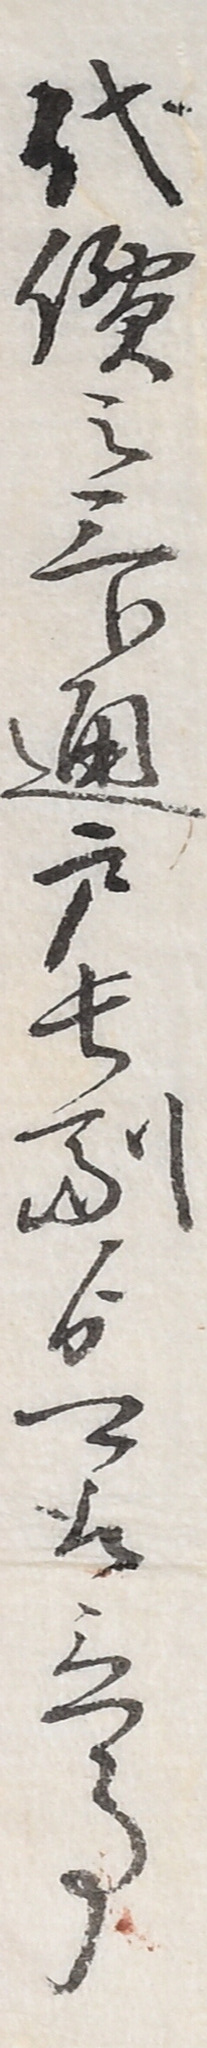代価之三分通戸長副より可取立事
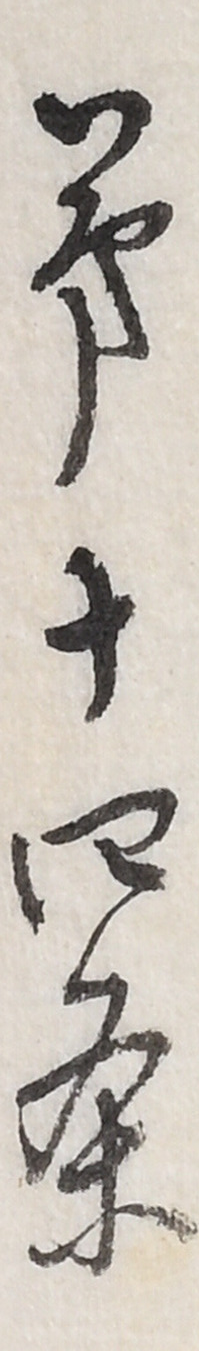第十四条
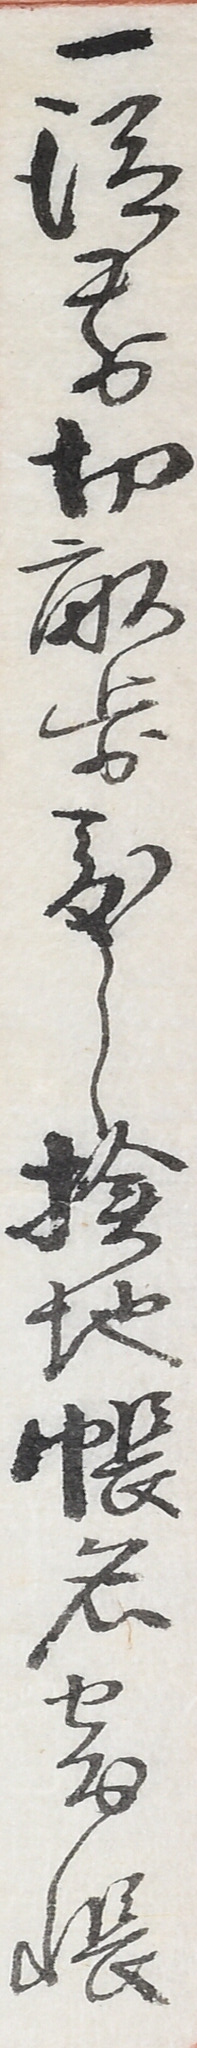一従前切畝歩致し検地帳名寄帳
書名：壹番・御布告一式
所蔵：伊那市立高遠町図書館・合同会社AMANE
